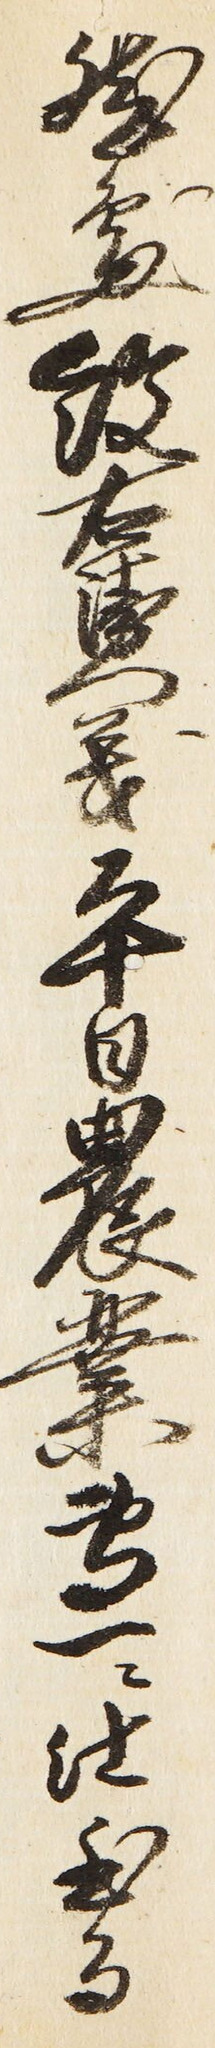然処政右衛門義平日農業専一ニ仕至而
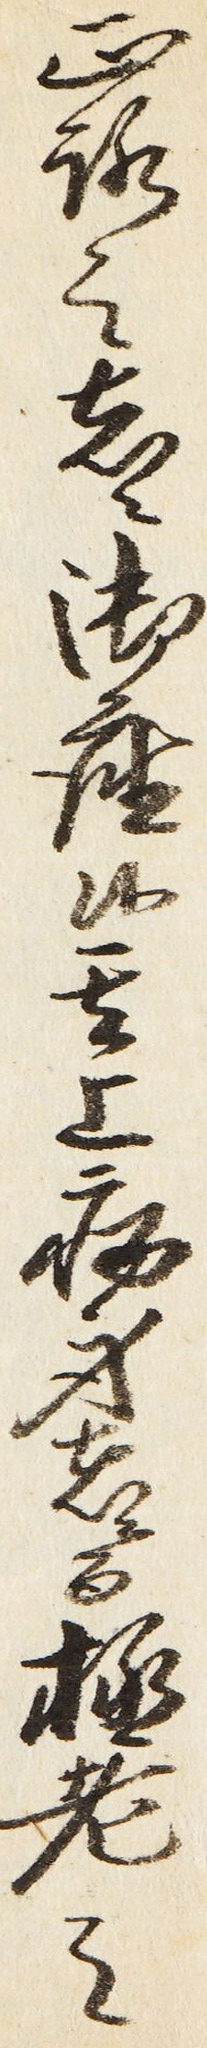正路之者ニ御座候其上病身者ニ而極老之
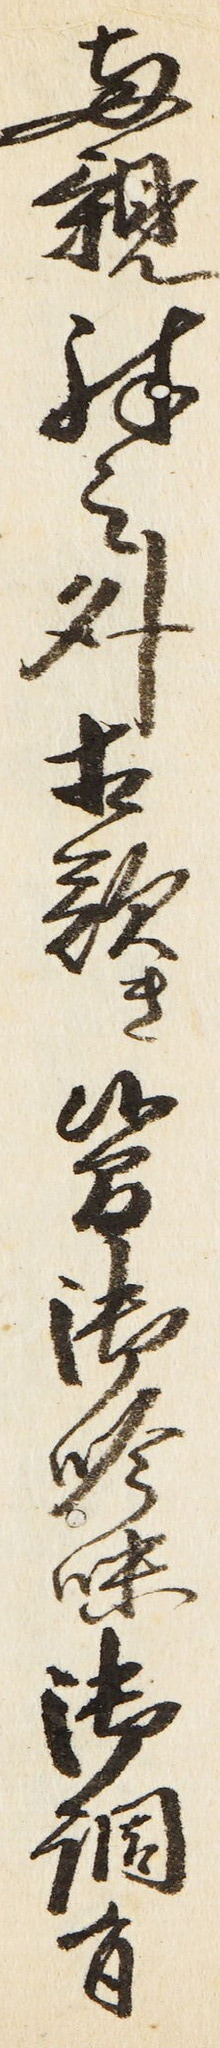両親殊之外相歎き候間御吟味御調有
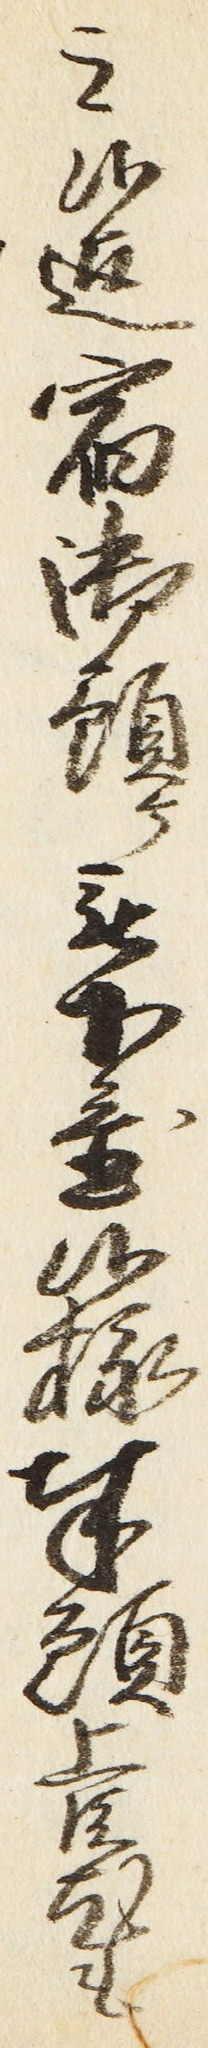之候迄宿御預ケ被下置候様奉願上候尤も
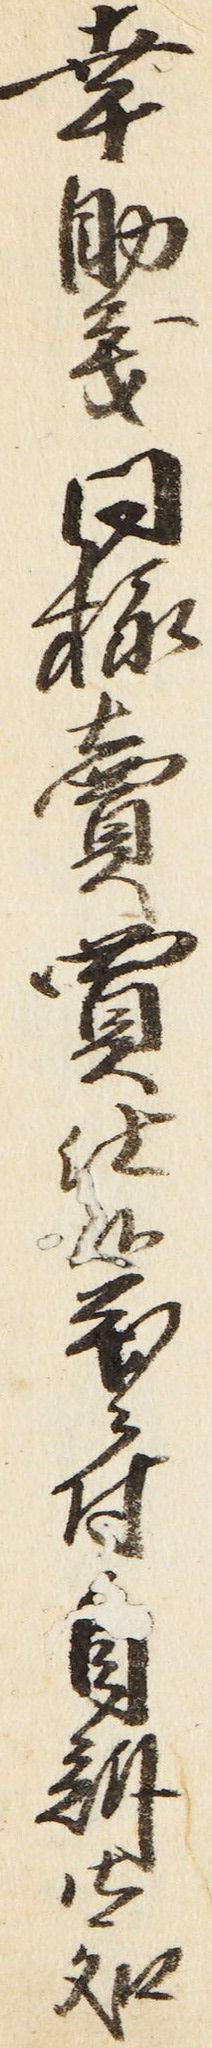幸助義同様売買仕候義ニ付自訴仕候処

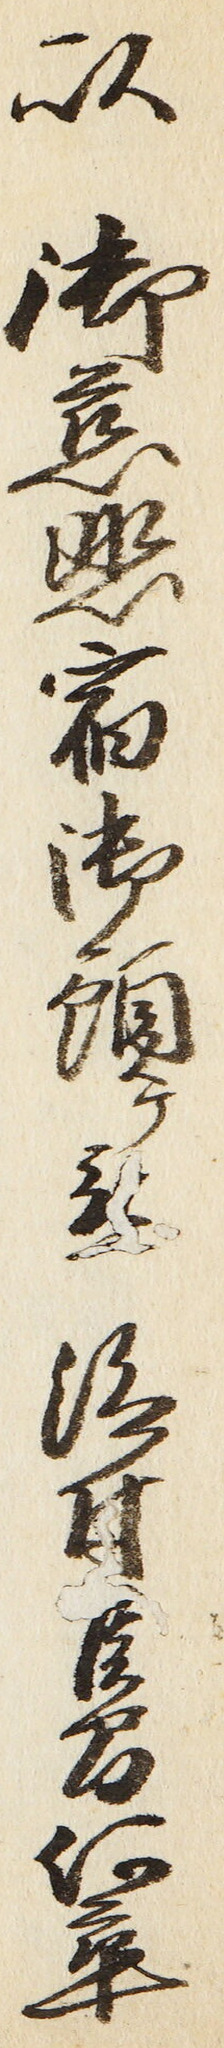以御慈悲宿御預ケ被仰付候間何卒
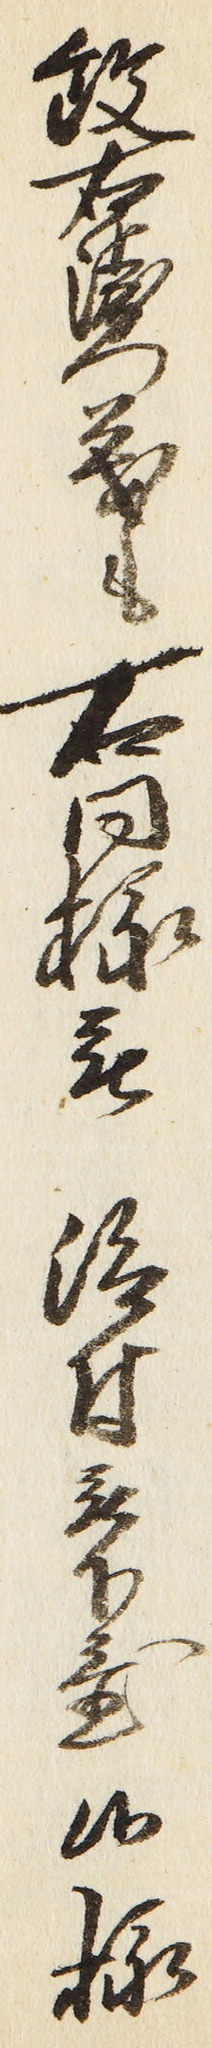政右衛門義も右同様被仰付被下置候様
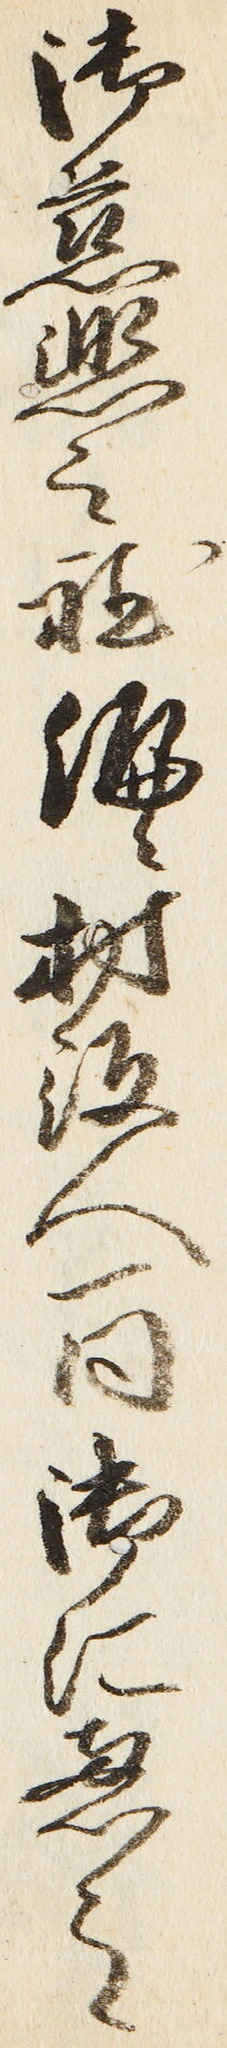御慈悲之程偏ニ村役人一同御仁恵之
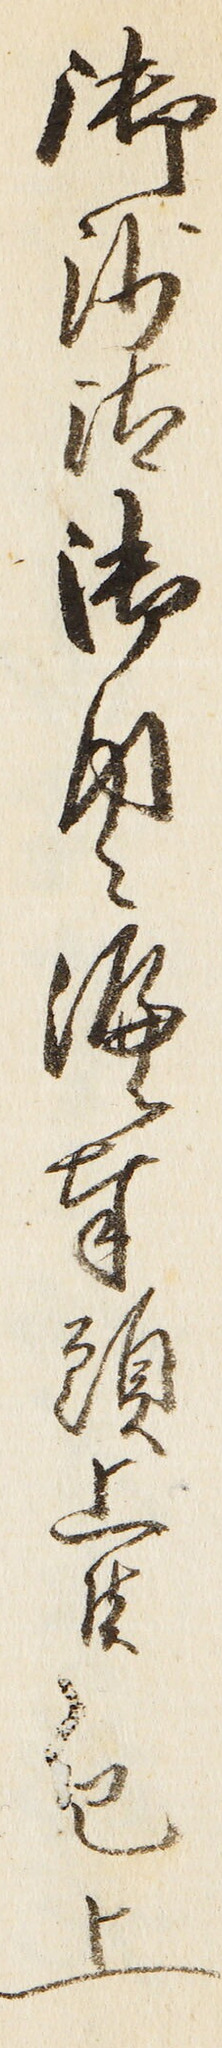御沙汰御内々偏ニ奉願上候已上
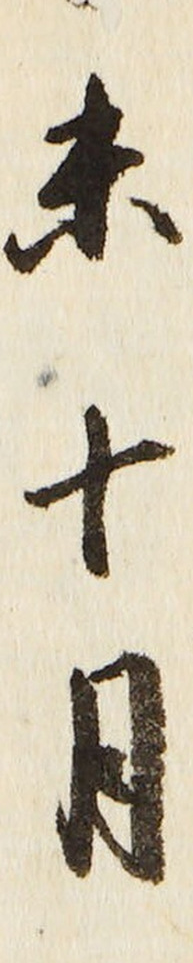未十月
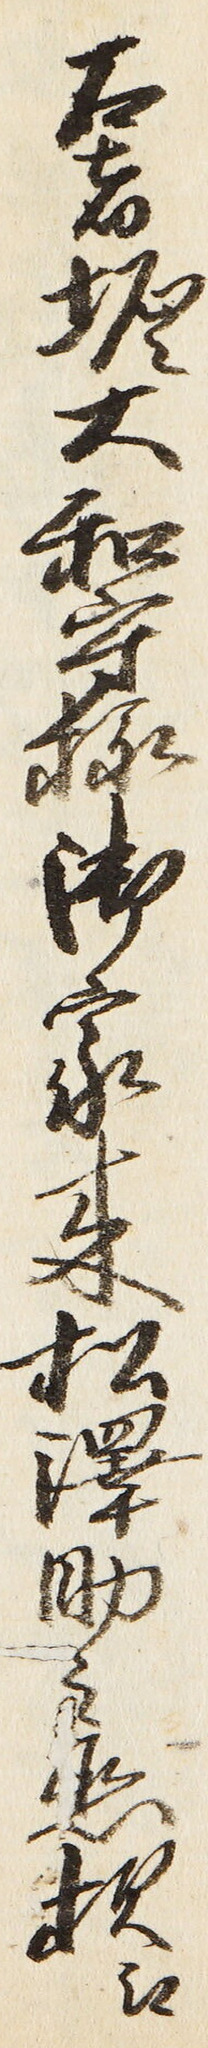右者堀大和守様御家来松沢助之丞様江
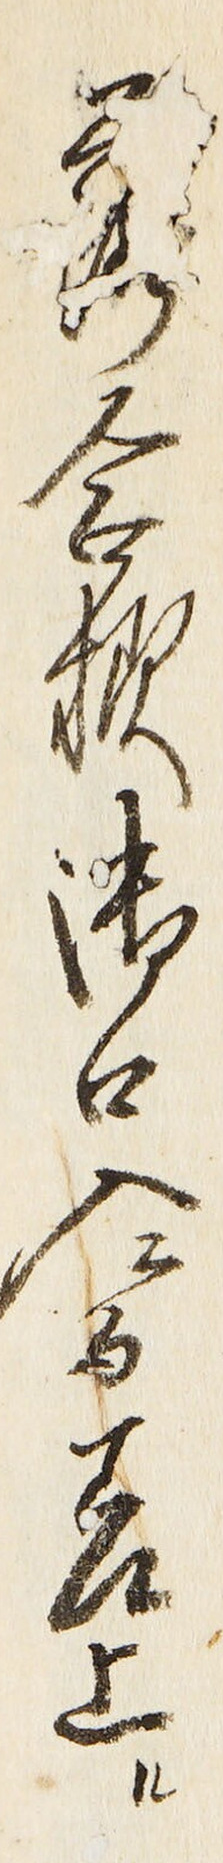合様御口入ニ而差上ル
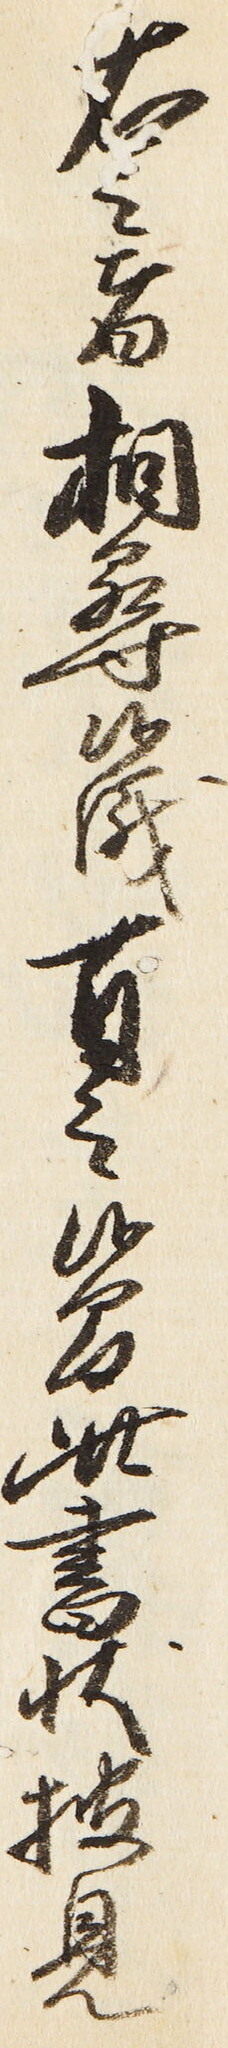右之者相尋候儀有之候間此書状被見
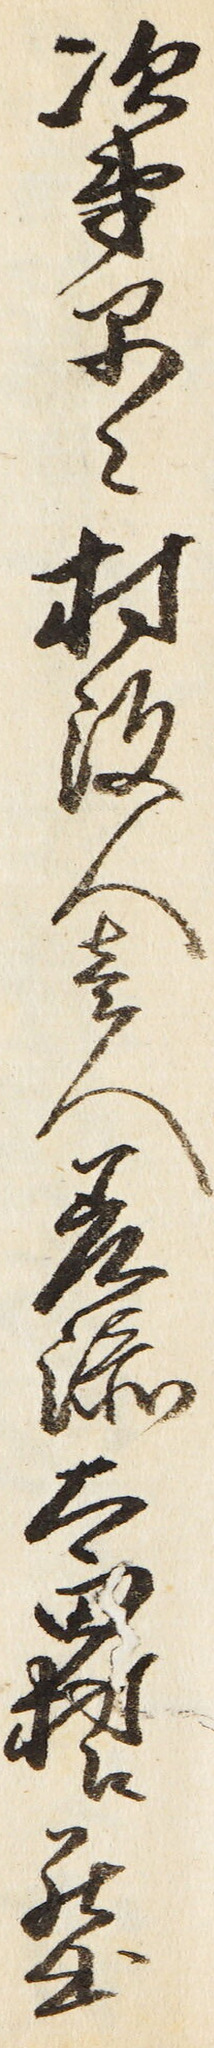次第早々村役人壱人差添太田村江罷出
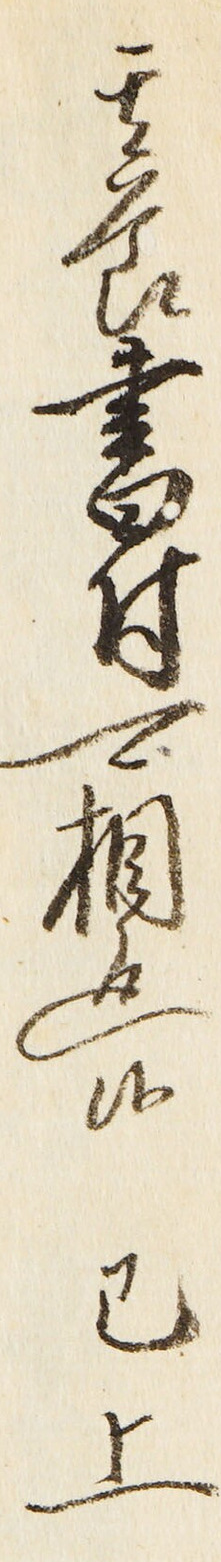其節書付可相返候已上
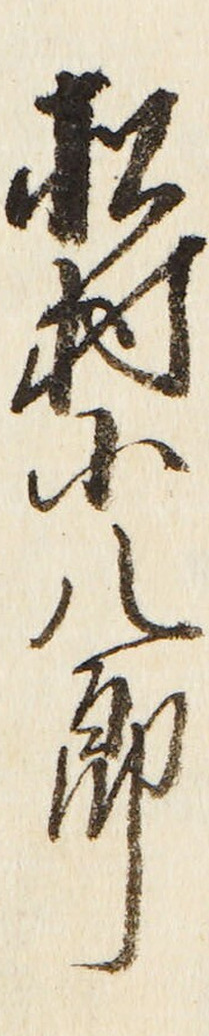松村小八郎
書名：難船一件記録
